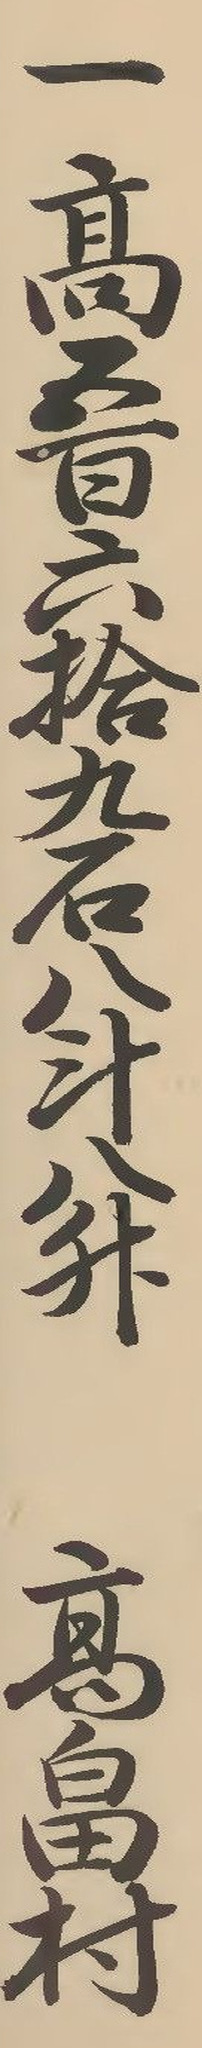一高五百六拾九石八斗八升高畠村
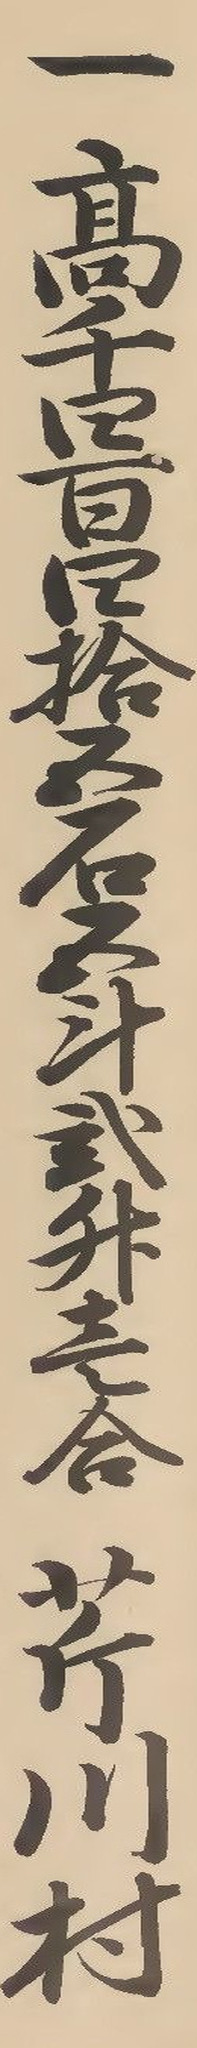一高千四百四拾五石五斗弐升壱合芹川村
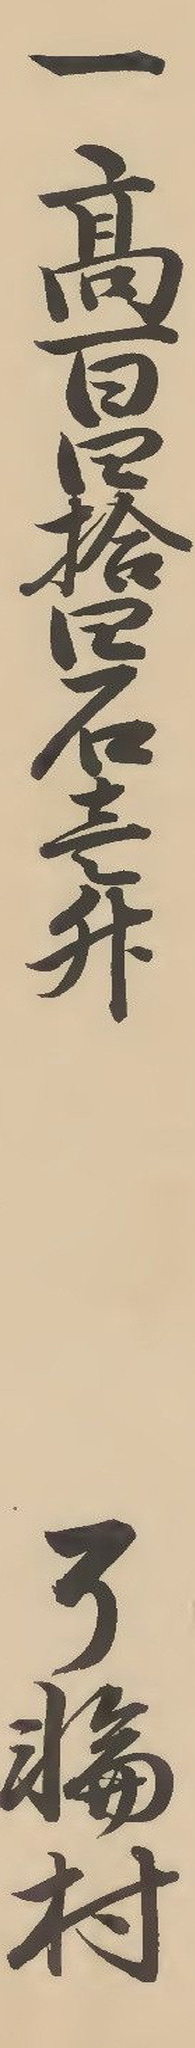一高百四拾四石壱升了輪村
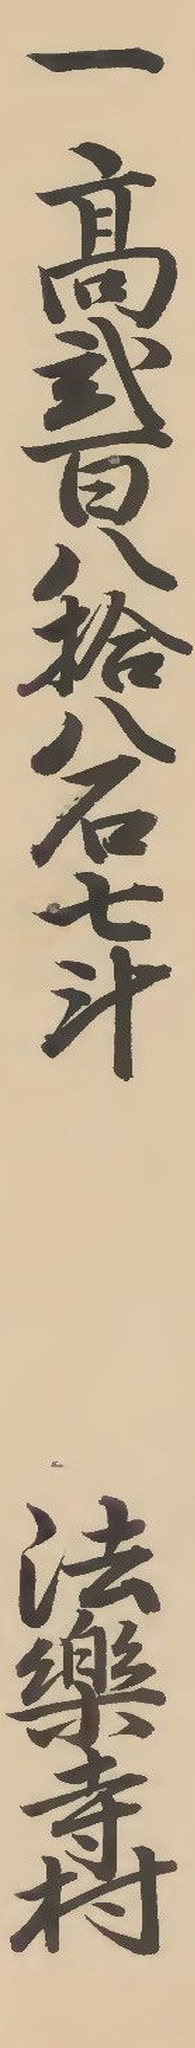一高弐百八拾八石七斗法楽寺村

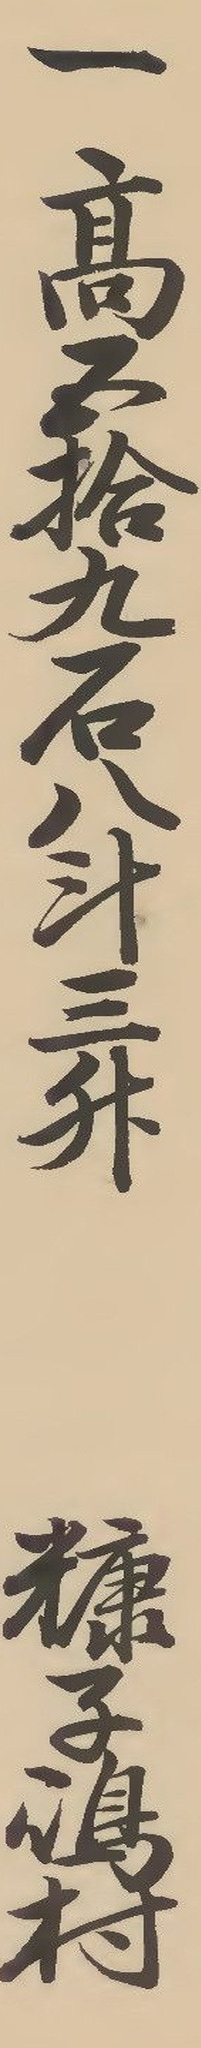一高五拾九石八斗三升糠子島村
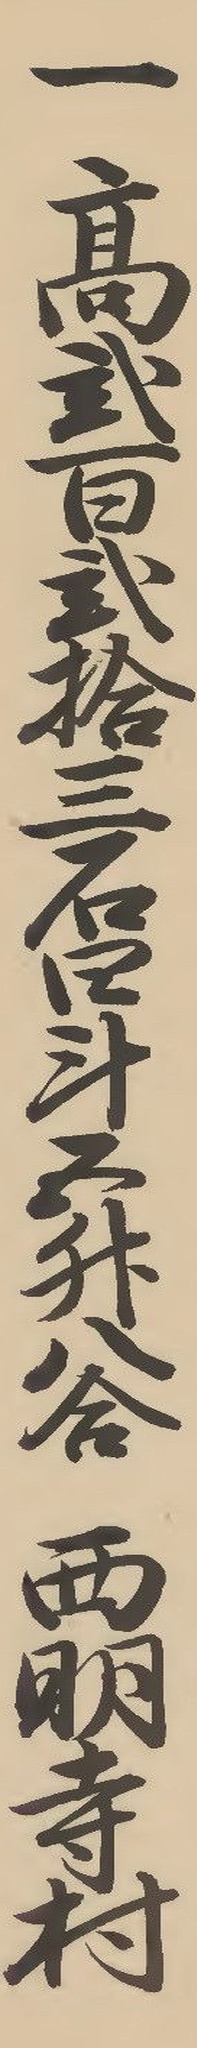一高弐百弐拾三石四斗五升八合西明寺村
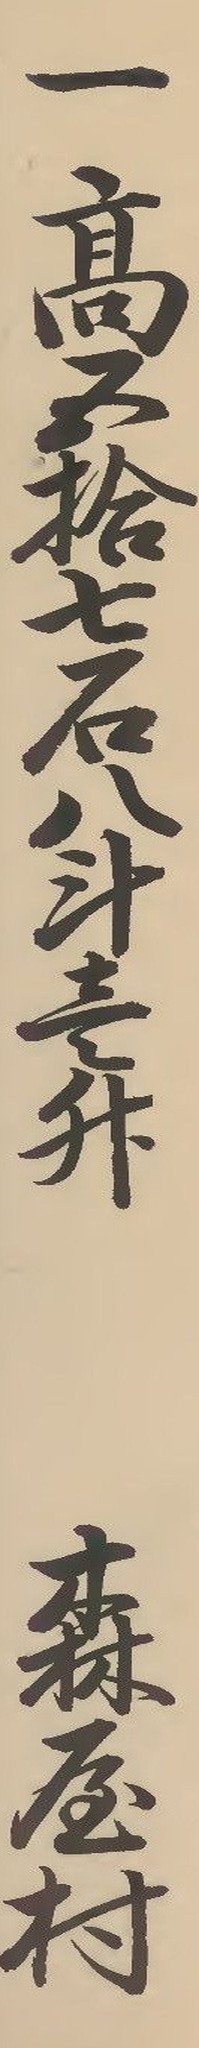一高五拾七石八斗壱升森屋村
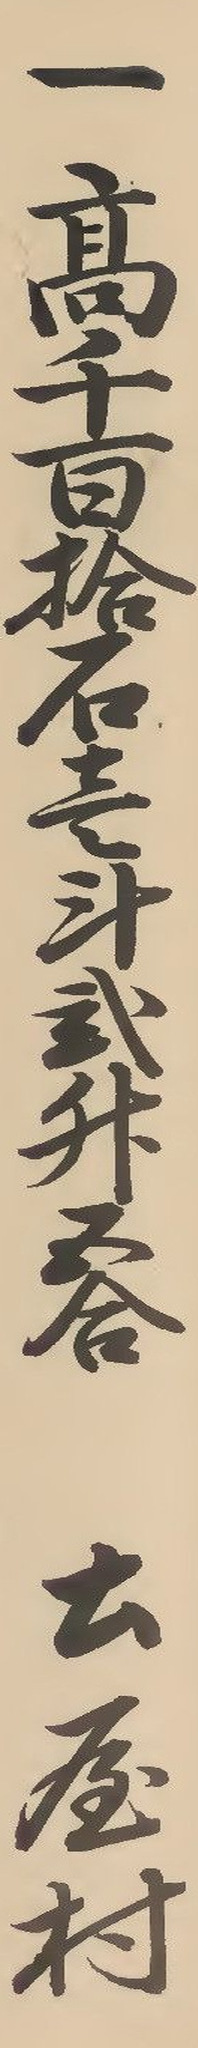一高千百拾石壱斗弐升五合土屋村
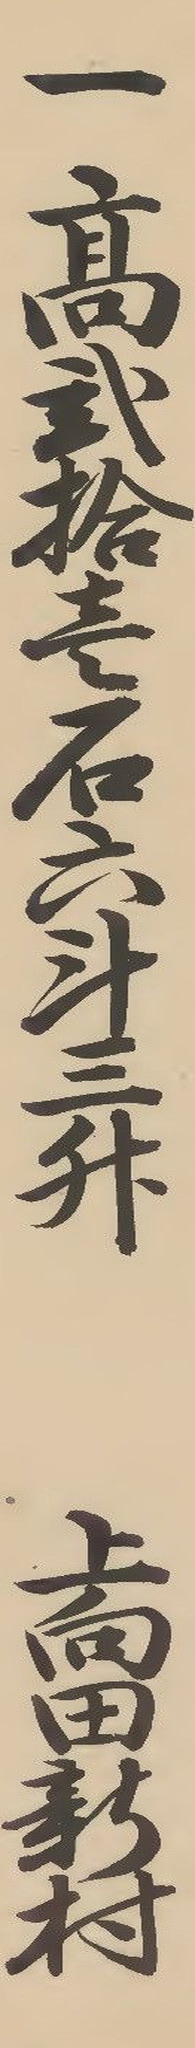一高弐拾壱石六斗三升上向田新村
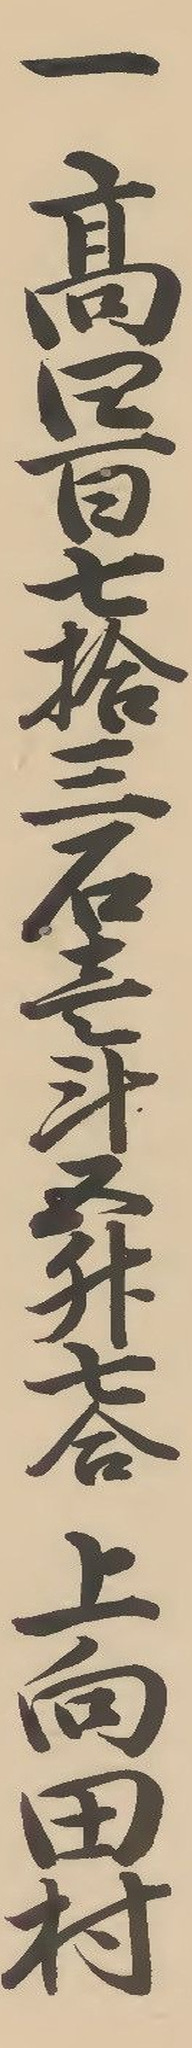一高四百七拾三石壱斗五升七合上向田村

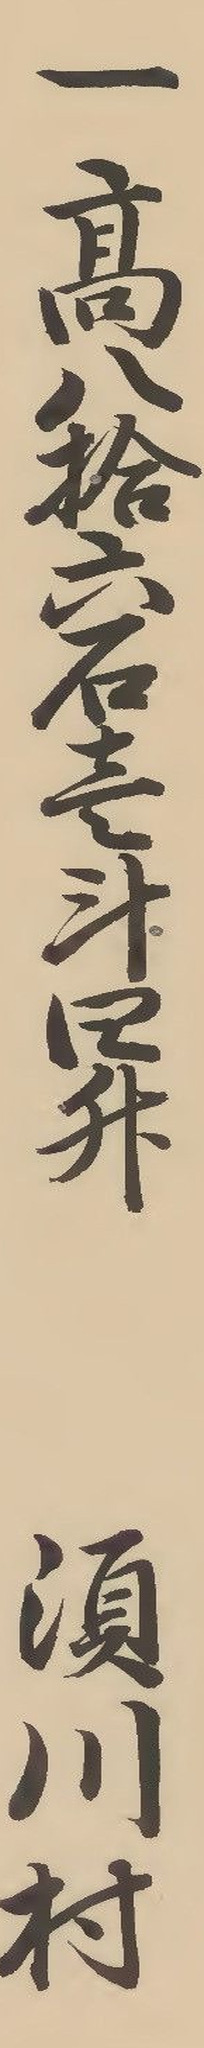一高八拾六石壱斗四升須川村
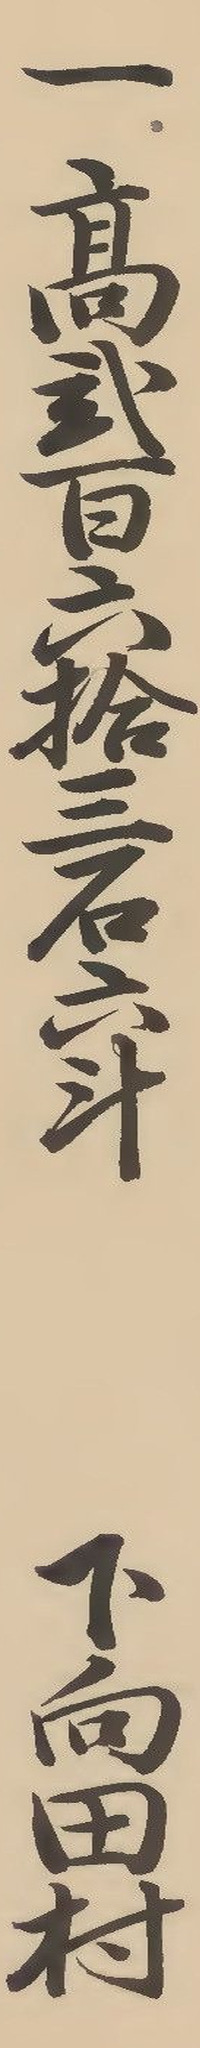一高弐百六拾三石六斗下向田村
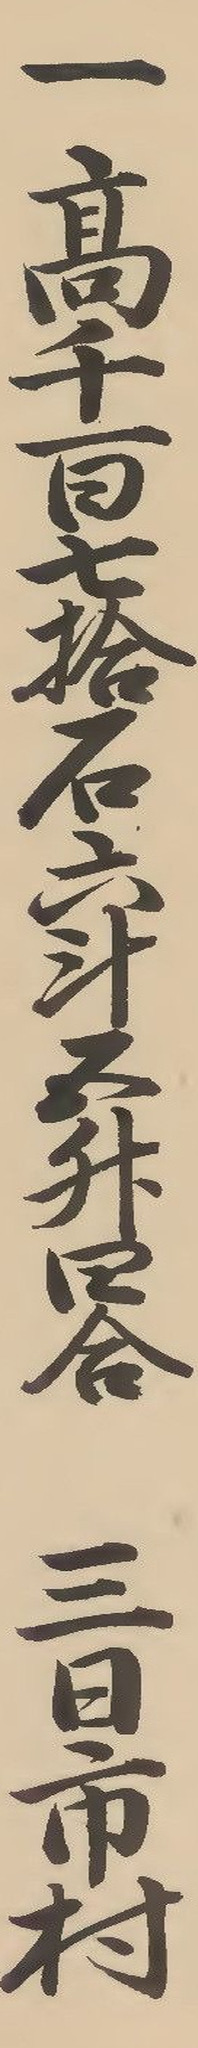一高千百七拾石六斗五升四合三日市村
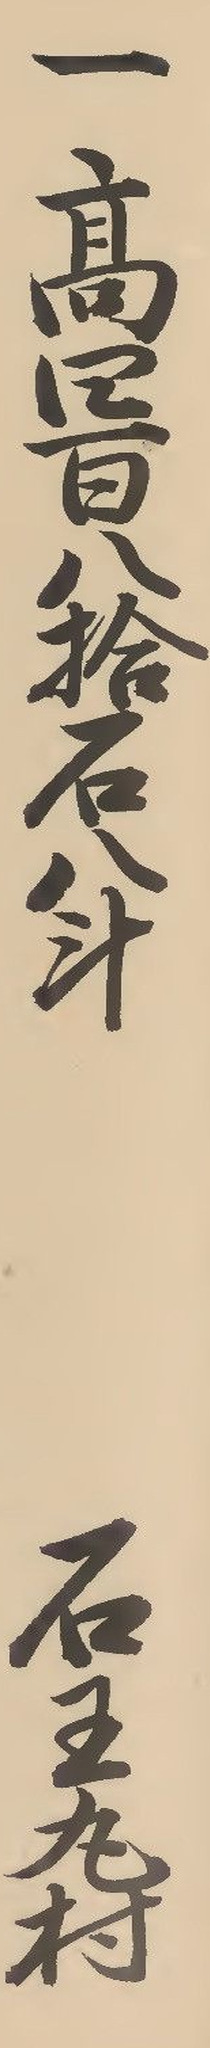一高四百八拾石八斗石王丸村
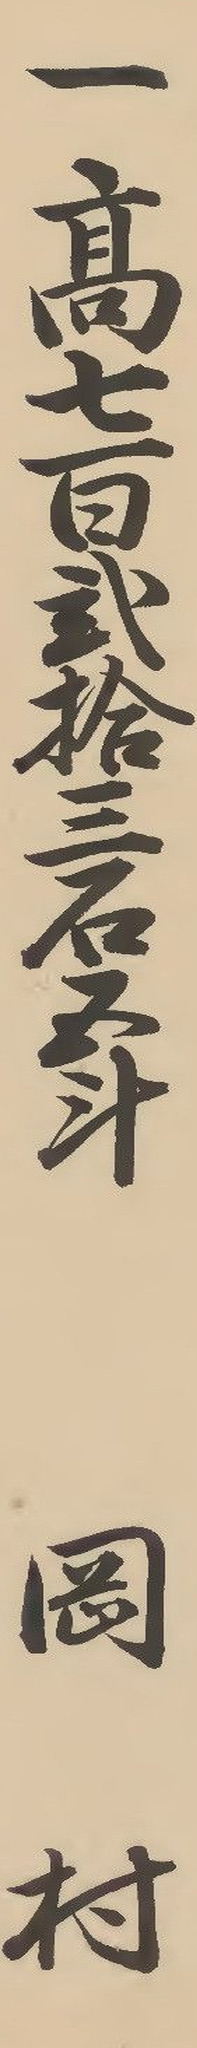一高七百弐拾三石五斗岡村
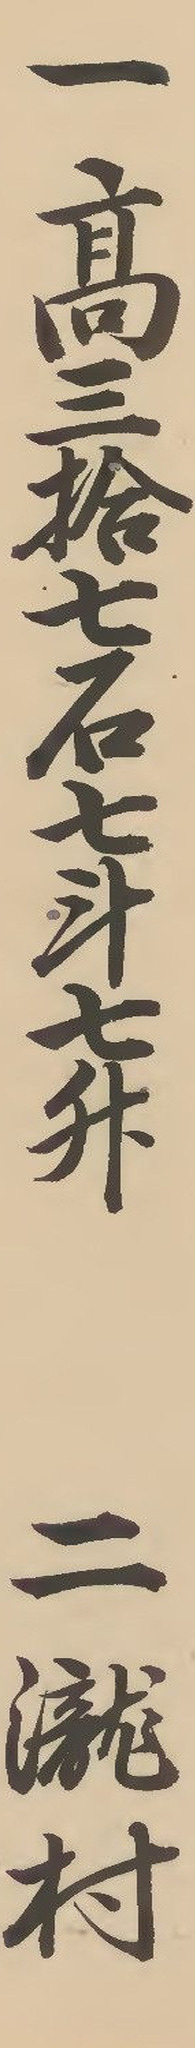一高三拾七石七斗七升二滝村
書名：越中国郷帳
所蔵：国立公文書館 National Archives of Japan
